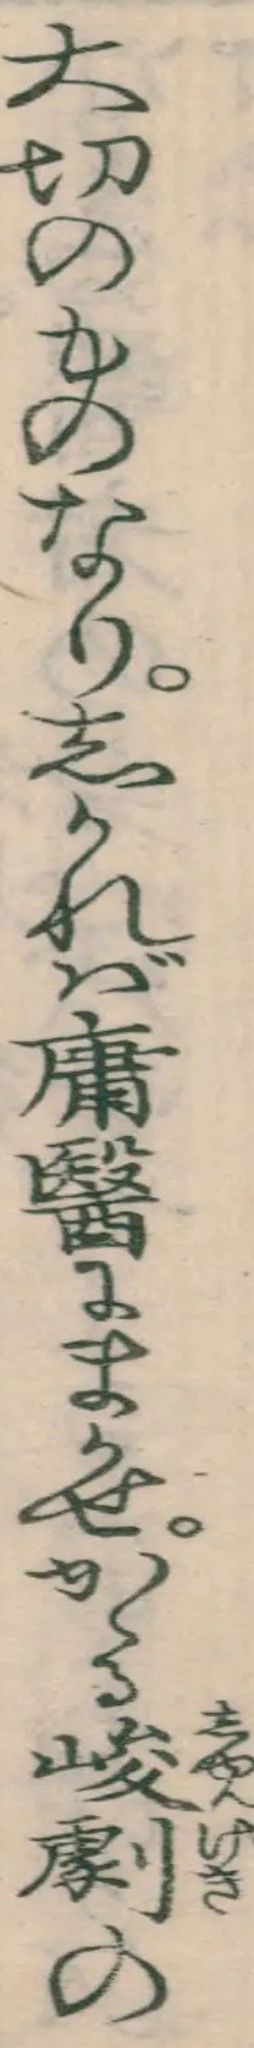大切のものなり。しかれば庸醫にまかぜ。かゝる峻劇の
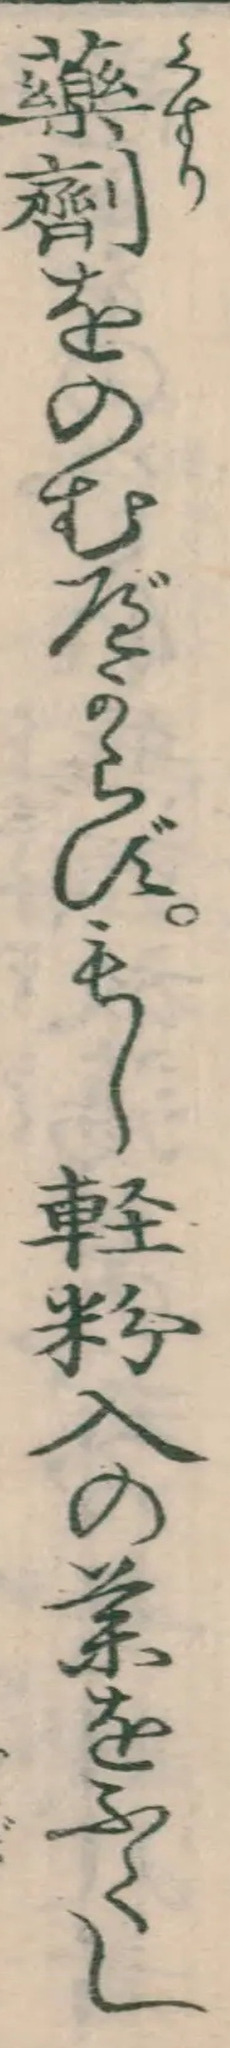藥劑をのむべからず。もし軽粉入の藥をふくし
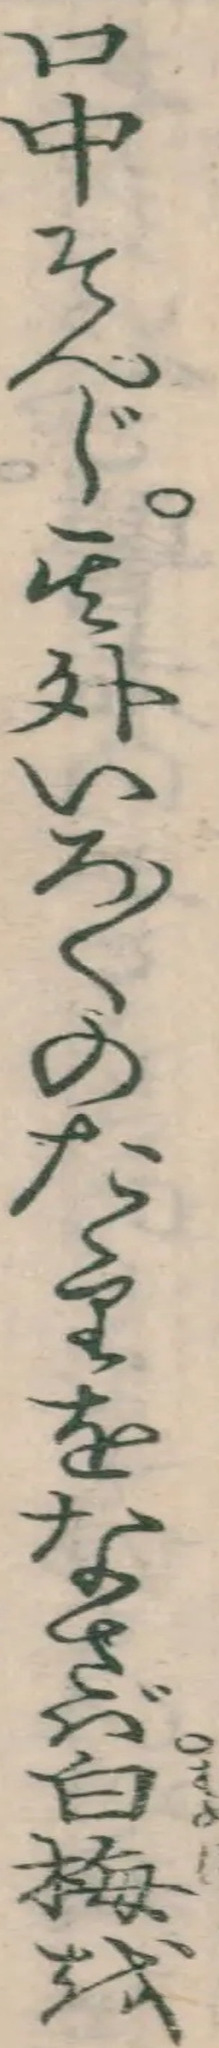口中そんじ。其外いろ〳〵のたゝりをなさば。白梅を
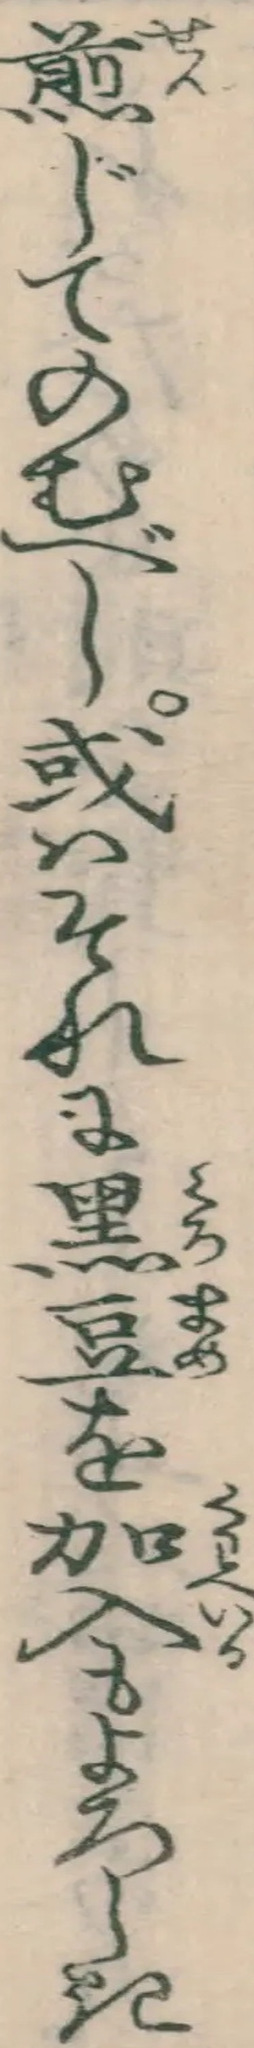煎じてのむべし。或はそれに黒豆を加入もよろしき
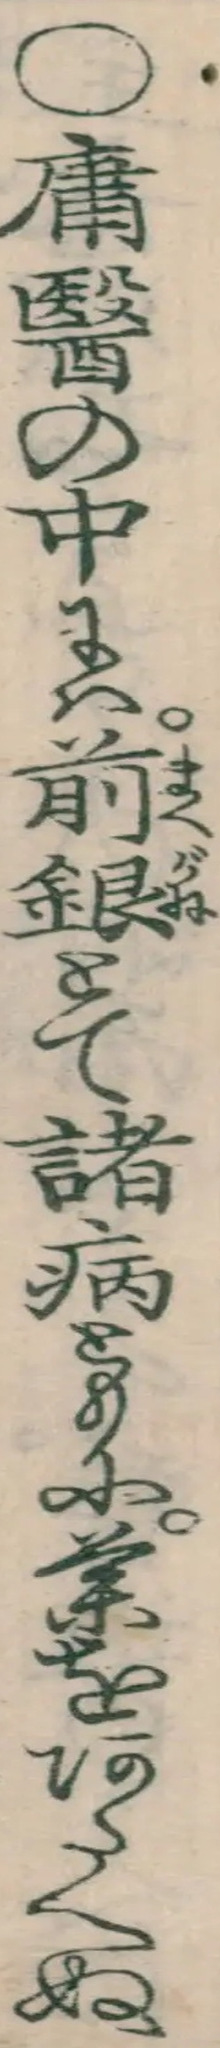〇庸醫の中には。前銀とて諸病ともに。藥をあたへぬ
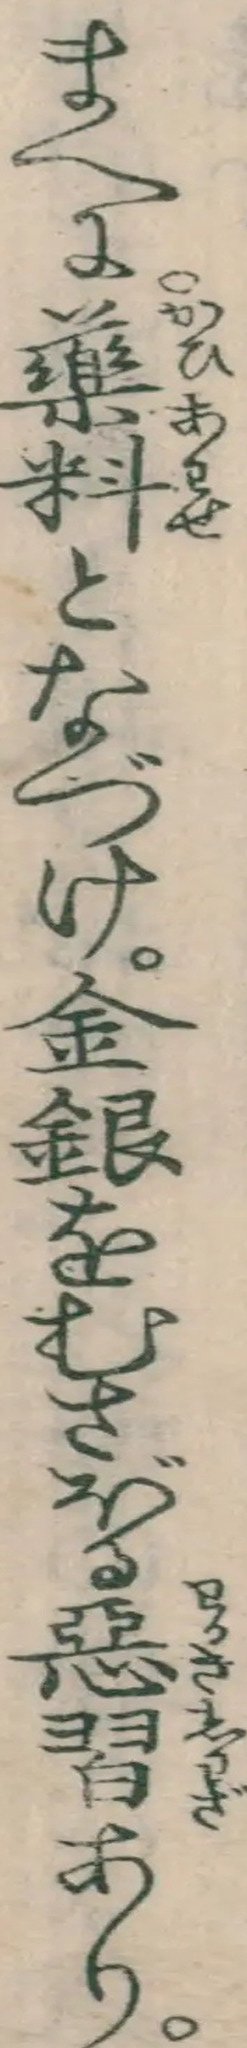まへに。藥料となづけ、金銀をむさぼる惡習あり。

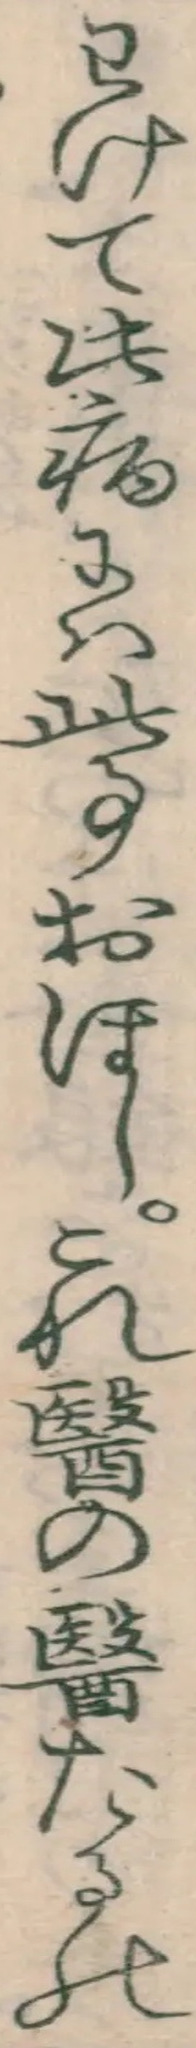わけて此病には此事おほし。これ醫たるの
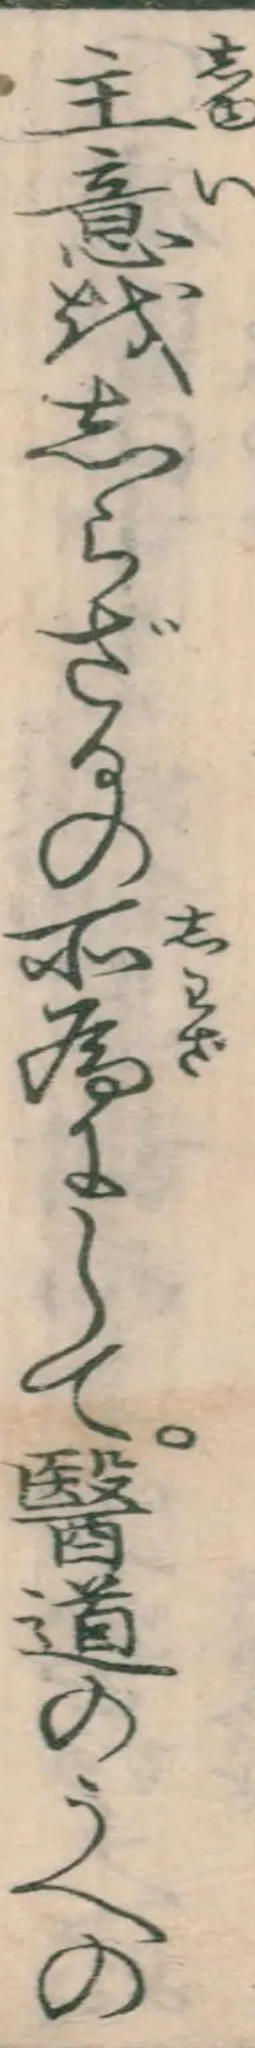主意をしらざるの所醫為にして。醫道のうへの
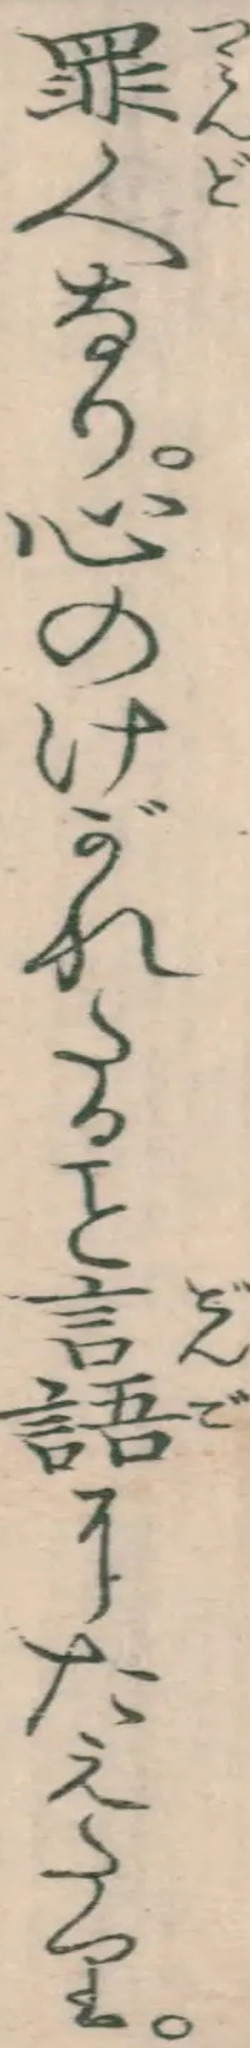罪人なり。心のけがれたること言語にたえたり。
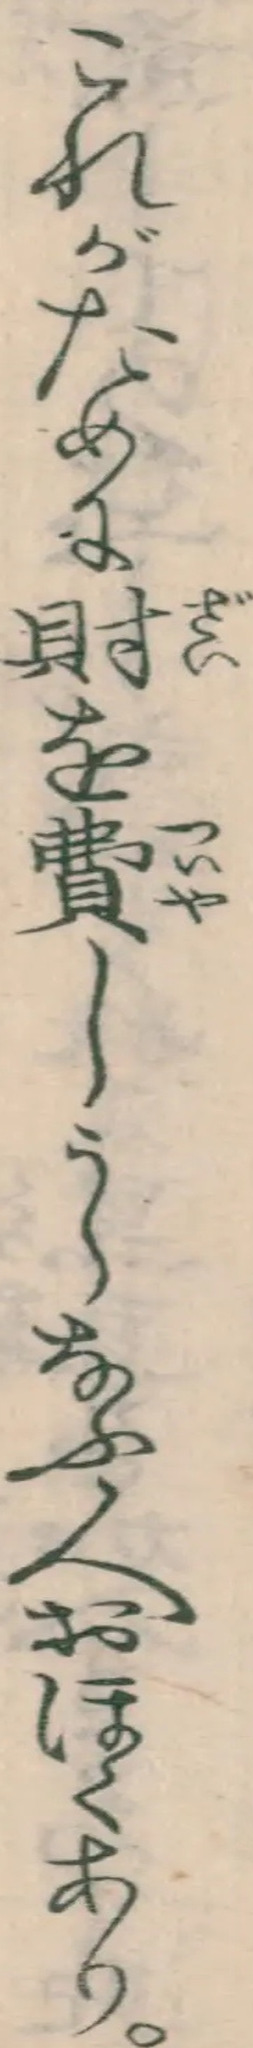これがために財を費しうしなふ人おほくあり。
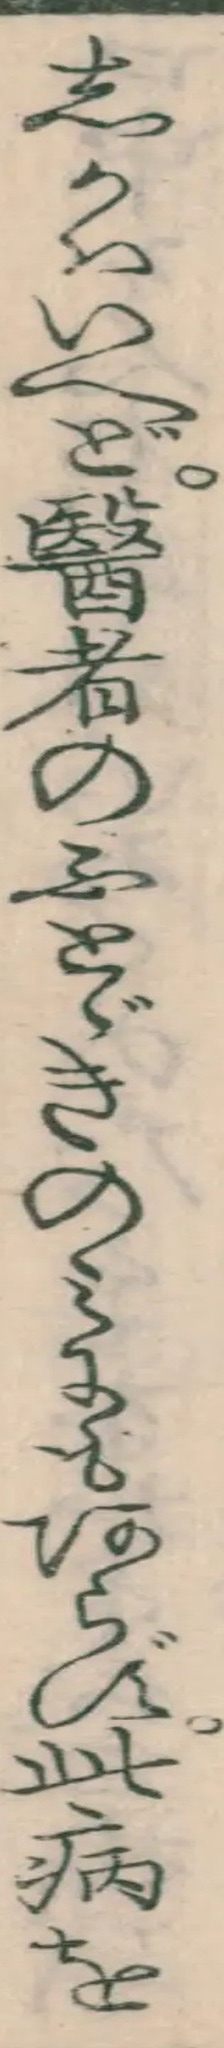しかはいへど。醫者のふとゞきのみにもあらず。此病を
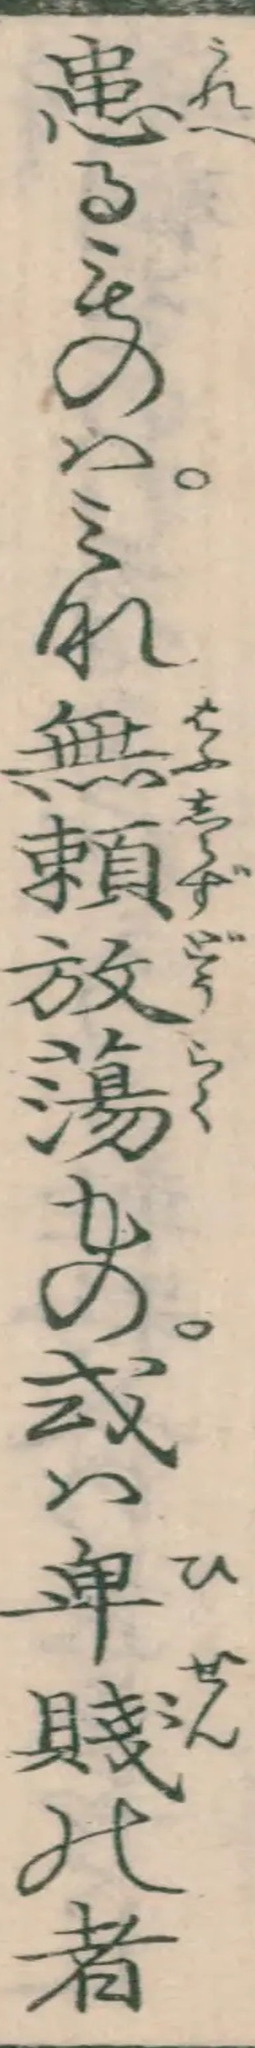患るものは。みな無頼放蕩もの。或は卑賎の者
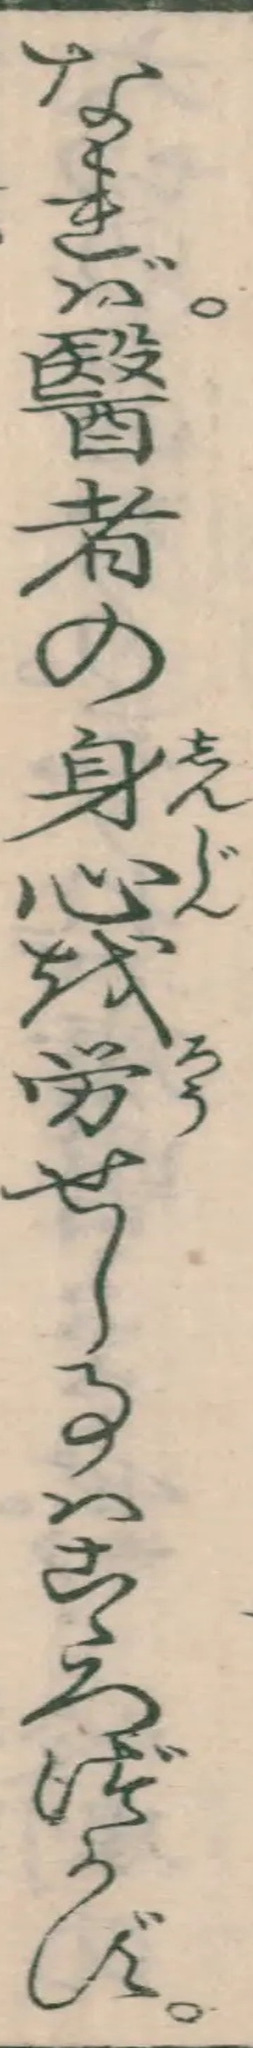なれば。醫者の身心を労せし事はこゝろづかず。
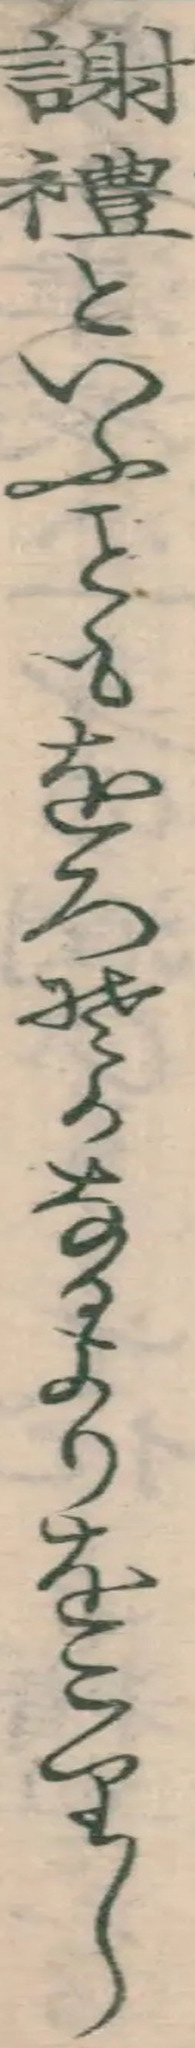謝禮といふこともをろそかなるよりをこりし
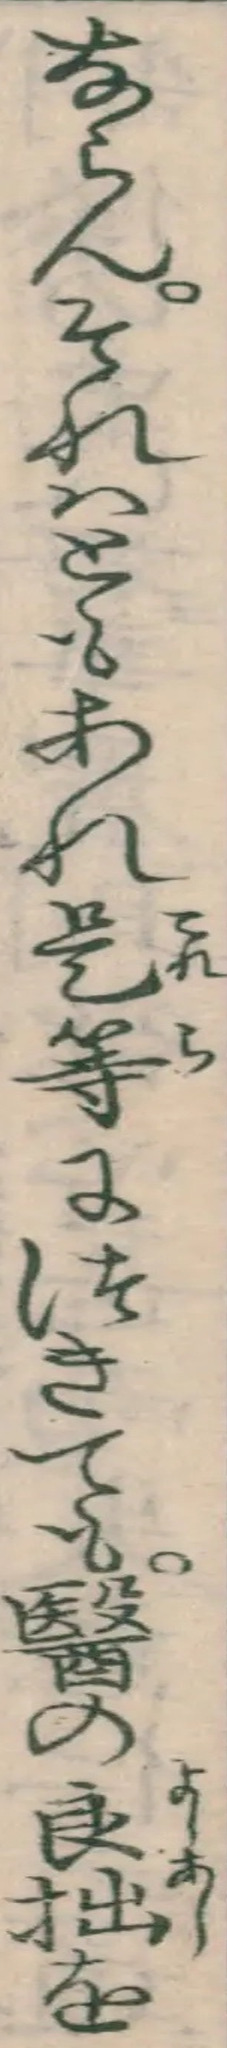ならん。それはともあれ是等につきても。醫の良拙を
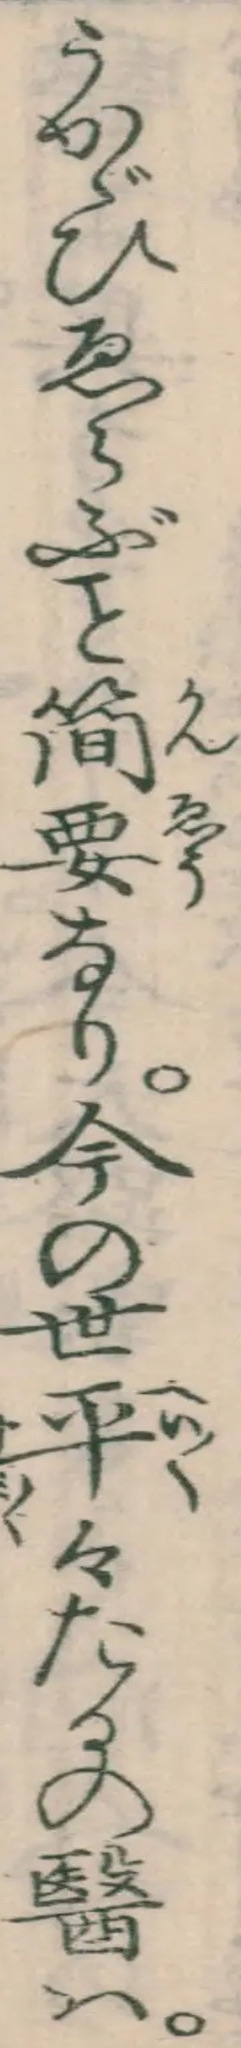うかゞひゑらぶこと簡要なり。今の世平々たるの醫は。
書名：瘡家示訓
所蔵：国立国会図書館 National Diet Library, JAPAN
